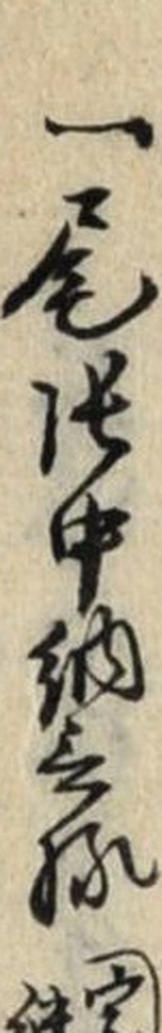一水戸中納言様
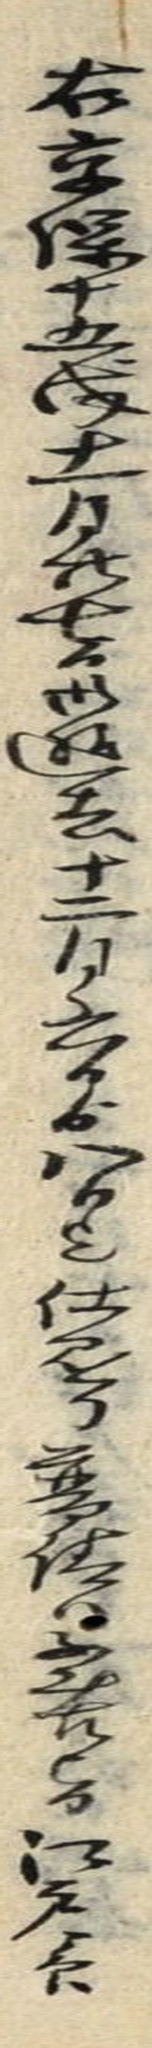右享保十五戌十一月廿七日御逝去十二月六日ゟ八日迄仕懸り普請は不苦旨江戸にては
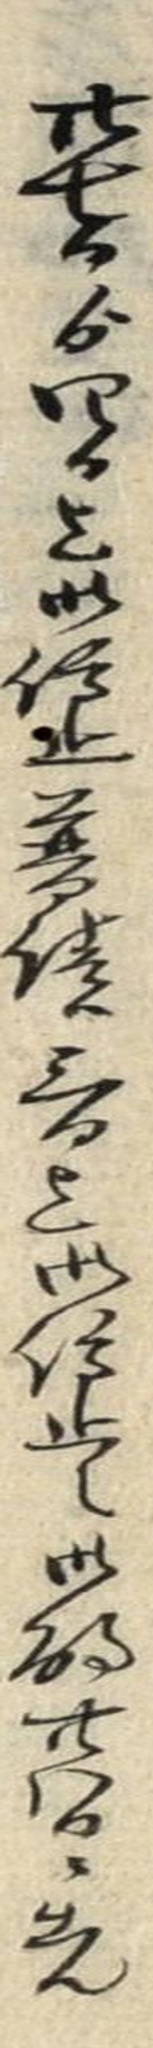廿七日ゟ四日迄御停止普請は三日迄御停止之御触廿八日に出ル
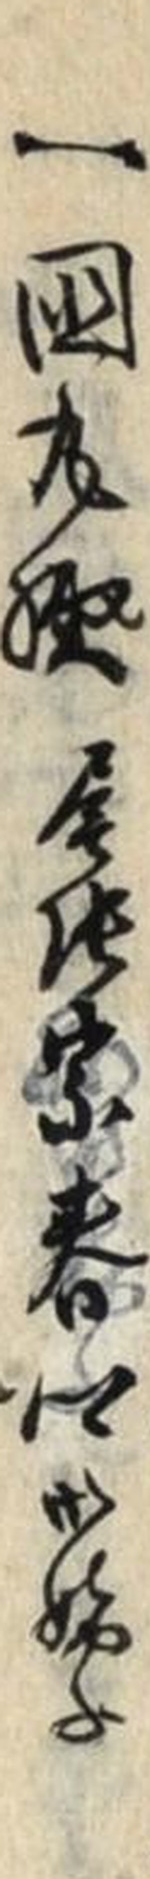一国丸様尾張宗春卿御嫡子
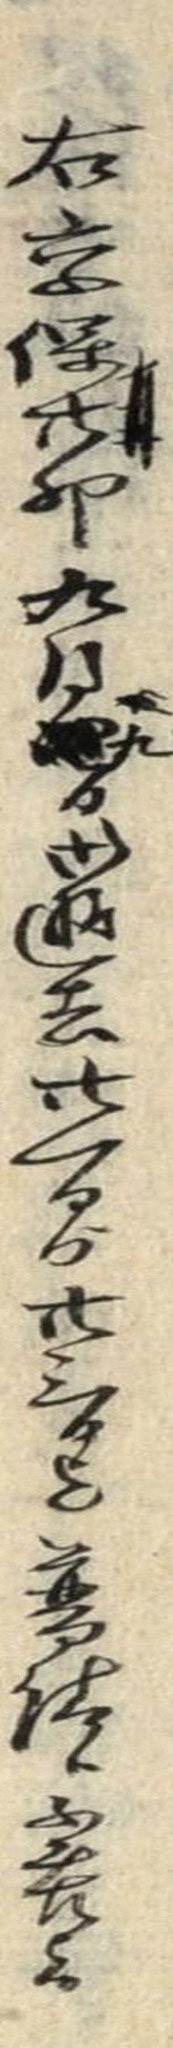右享保廿卯九月九日御逝去廿一日ゟ廿三日迄普請は不苦旨
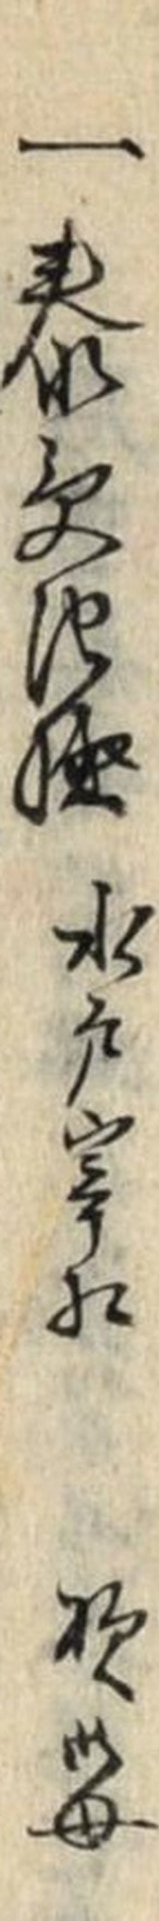一泰受院様水戸宰相様御母
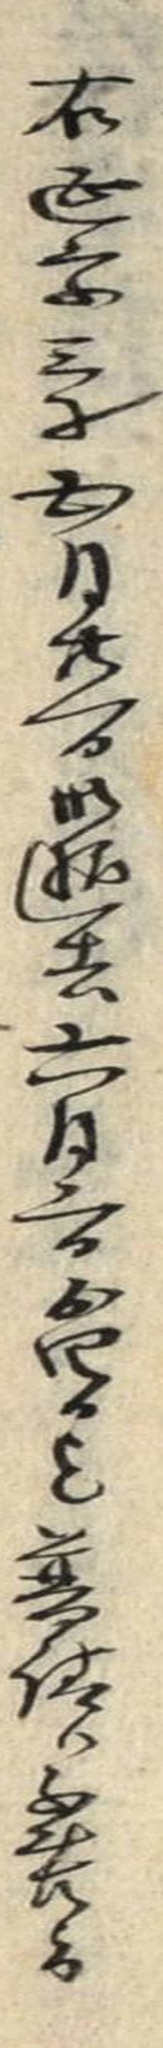右延享三刁五月廿一日御逝去六月二日ゟ四日迄普請は不苦旨
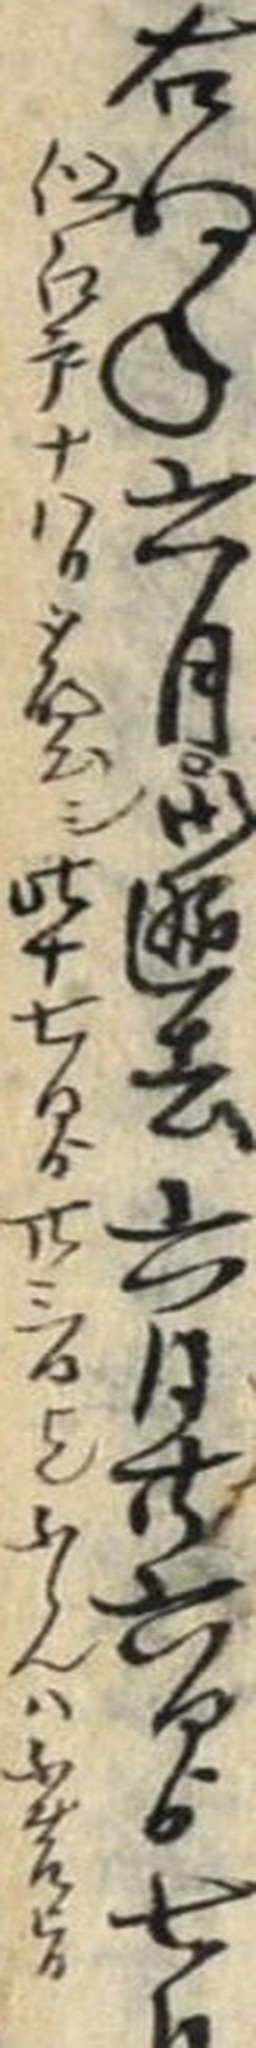但江戸十八日御触出シ昨十七日ゟ廿三日迄ふしんは不苦旨

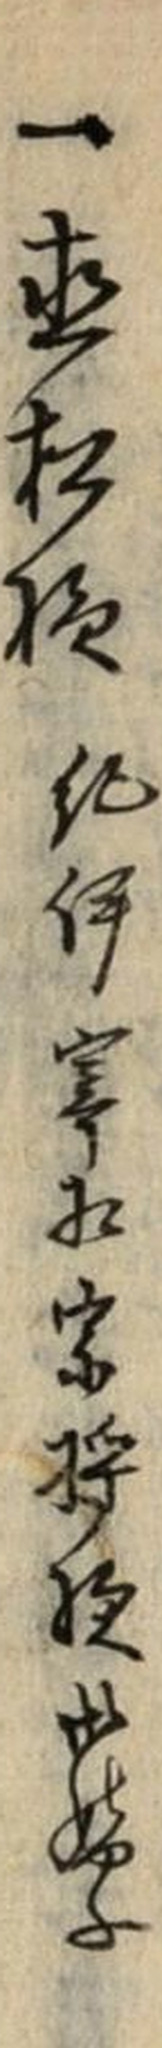一直松様紀伊宰相宗将様御嫡子
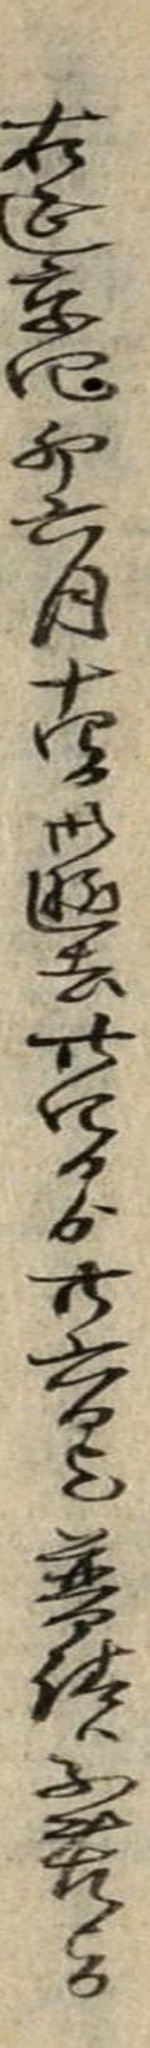右延享四卯六月十四日御逝去廿四日ゟ廿六日迄普請は不苦旨
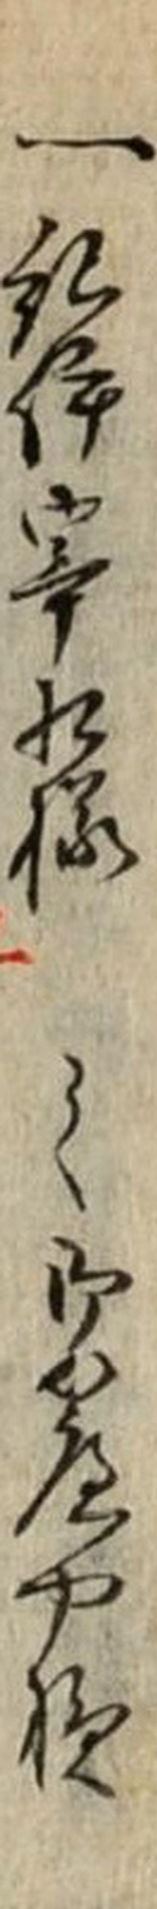一紀伊宰相様之御簾中様
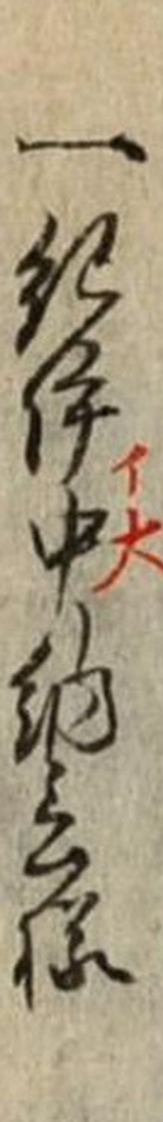一紀伊中納言様
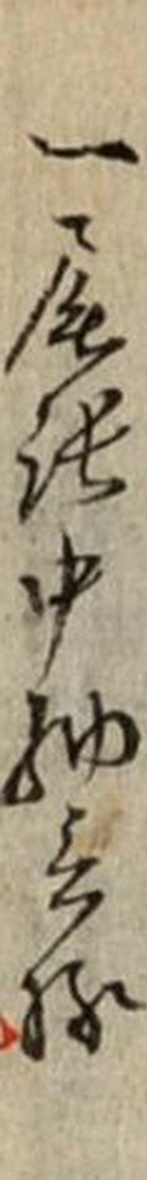一尾張中納言様
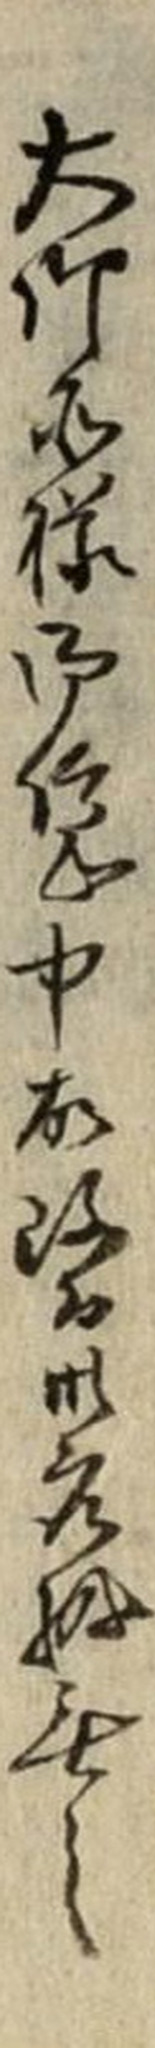大御所様御停止中故改て御取扱無之
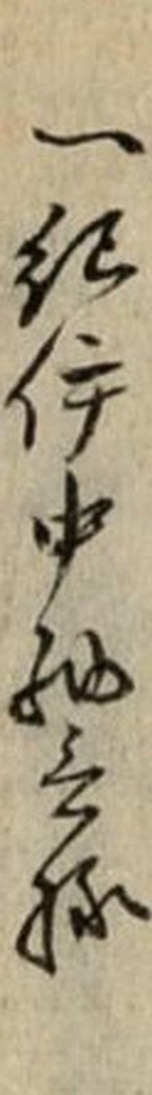一紀伊中納言様
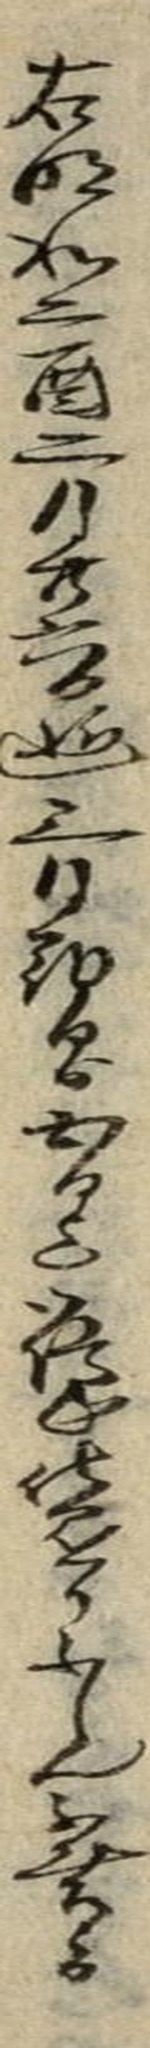右明和二酉二月廿六日逝三月朔日ゟ五日迄御停止仕懸りふしん不苦旨
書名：御停止異変死失
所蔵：福井県文書館 Fukui Prefectural Archives
